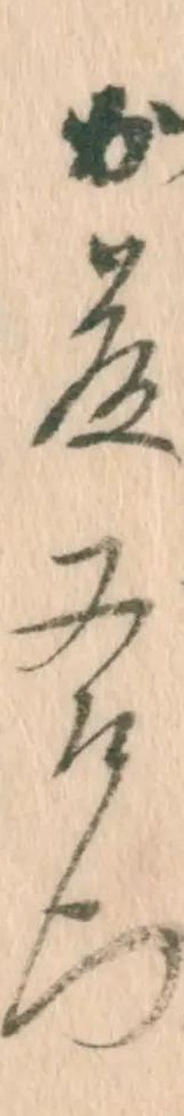加藤又左衛門
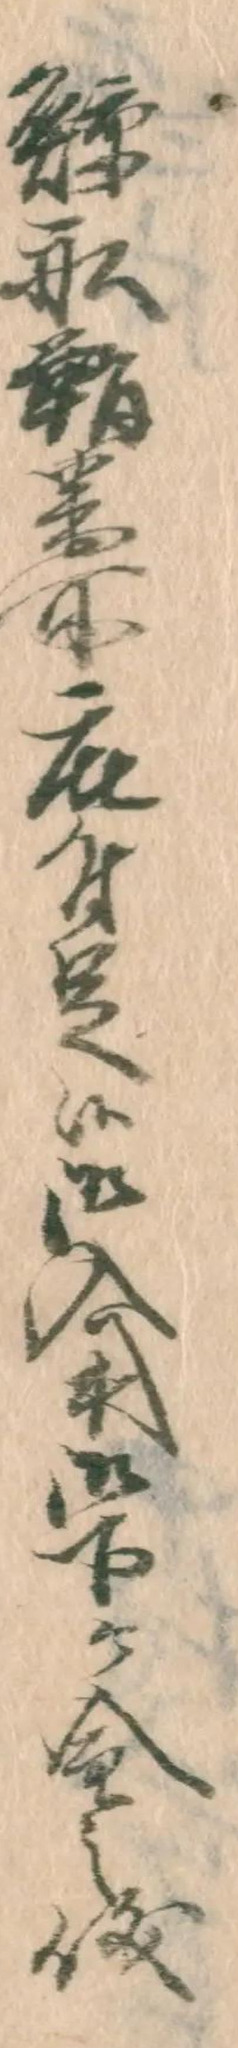鯨船鞘番所庇付足候御入用御下ケ金之儀
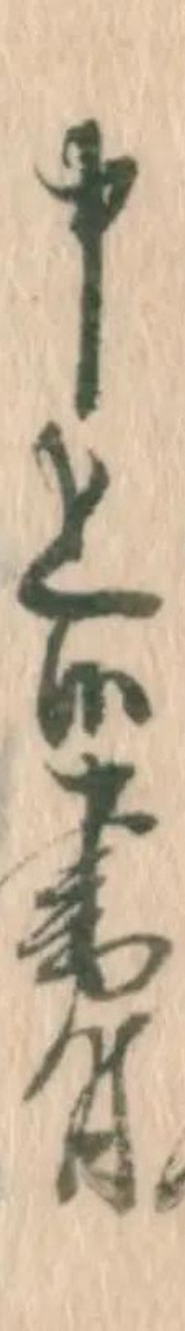申上候書付
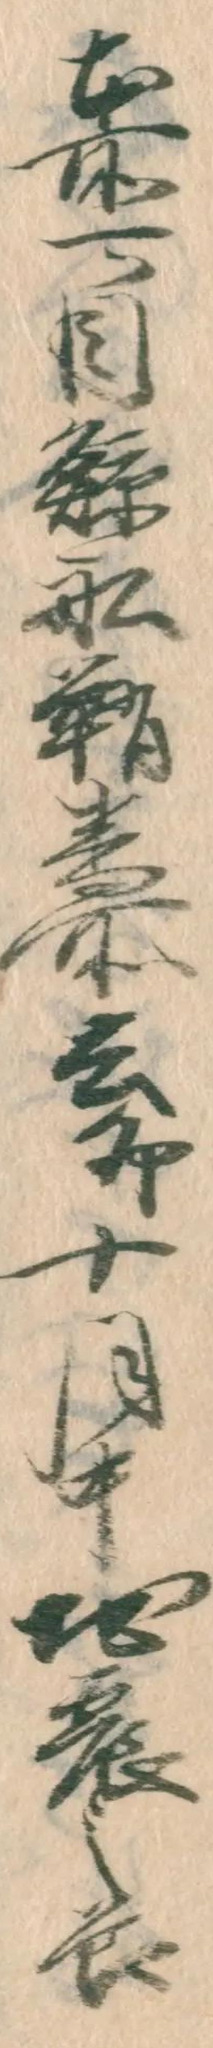本所一ツ目鯨船鞘番所去卯十月中地震之節
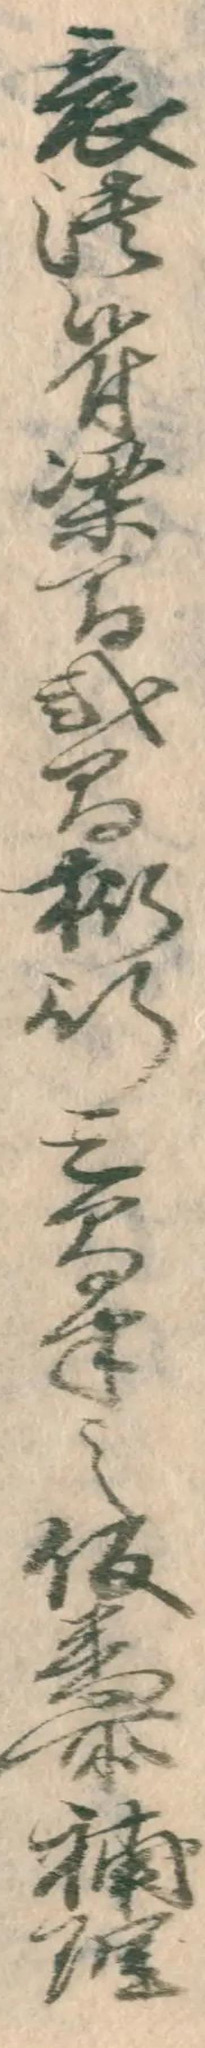震潰候付梁間弐間桁行三間半之仮番所補理
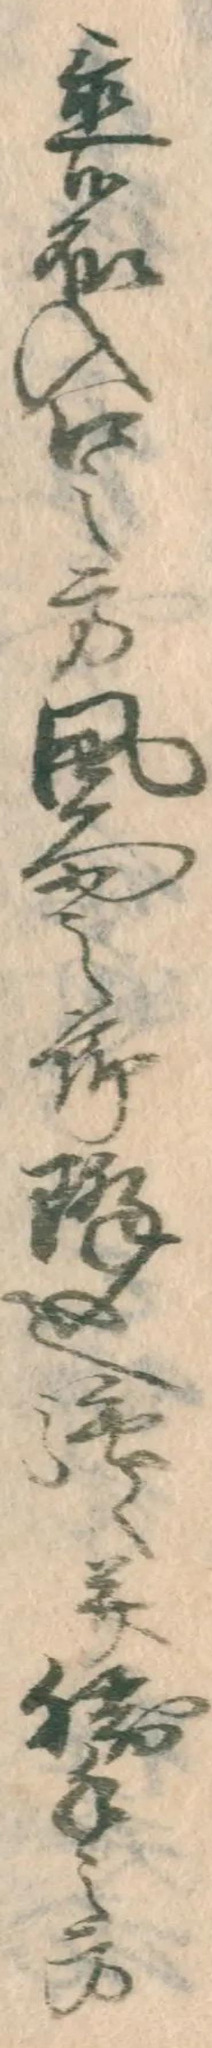置候処入口之方風雨之節降込強く并勝手之方

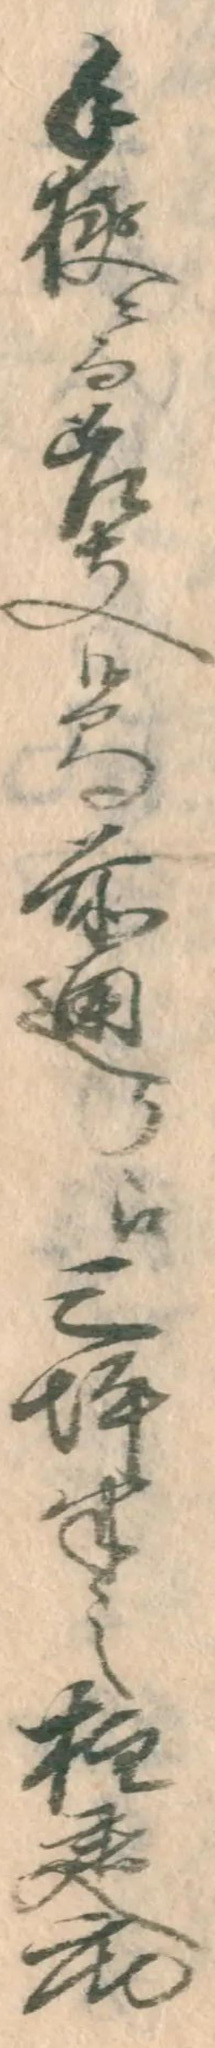手狭ニ而差支候間前通り江三坪半之柱建庇
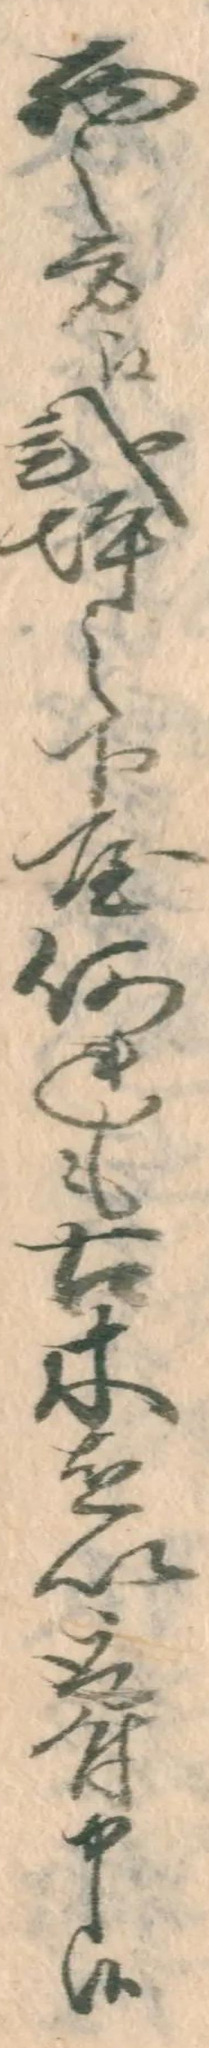西之方江弐坪之下屋何れも古木を以取申付候
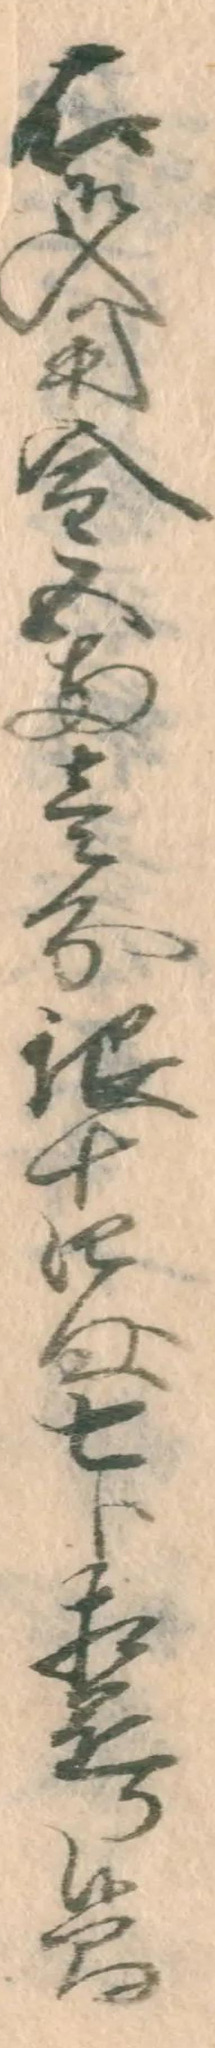右御入用金五両壱分銀十四匁七分相懸り候間
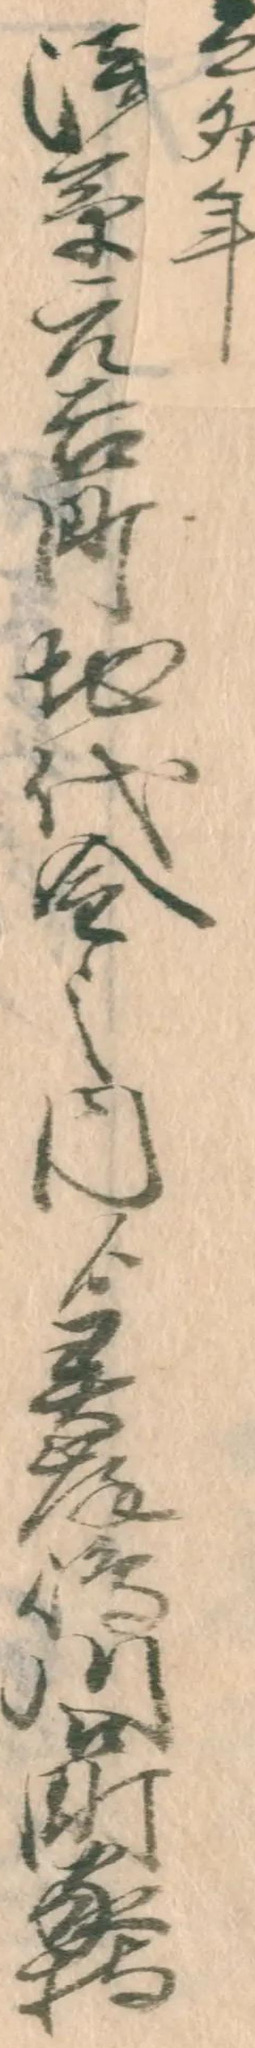浅草元吉町地代金之内ゟ霊岸嶋川口町家持
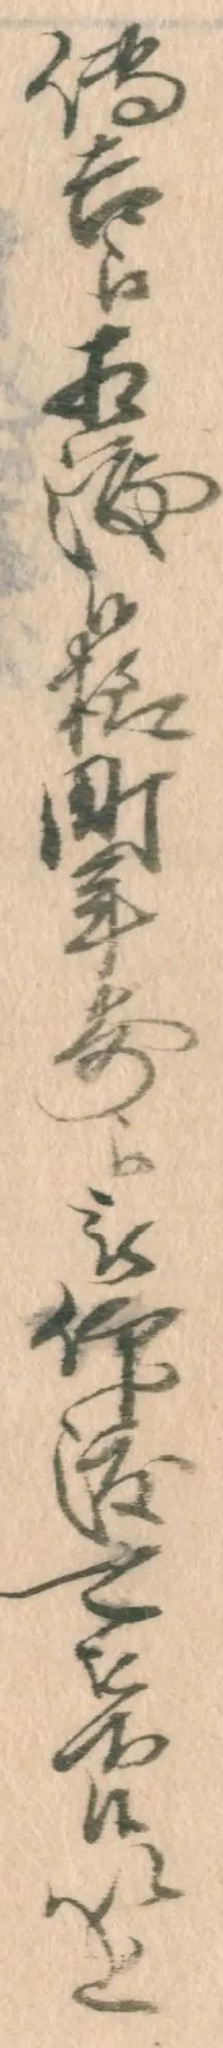伝吉江相渡候様町年寄江被仰渡可被下候以上
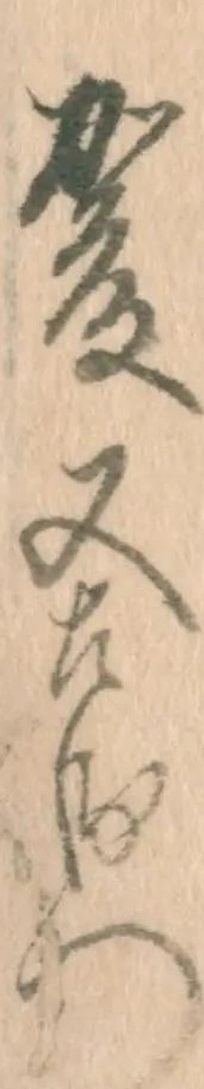加藤又左衛門
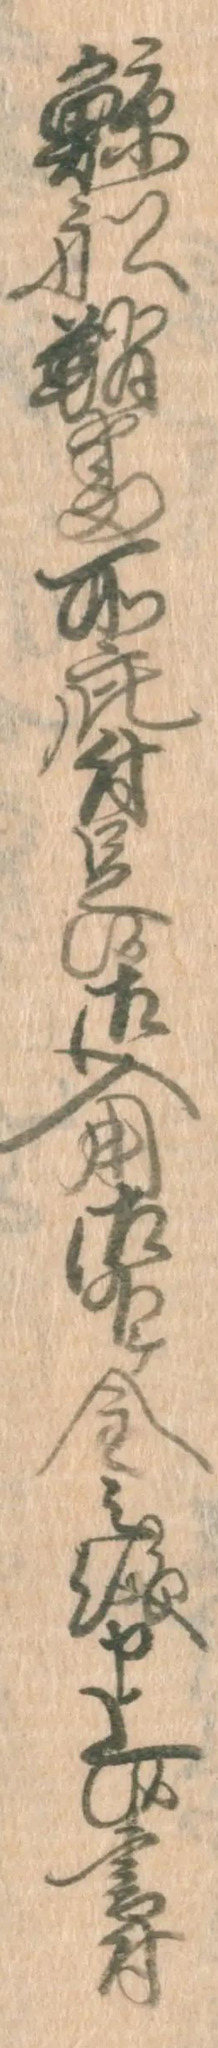鯨船鞘番所庇付足候御入用御下ケ金之儀申上候書付
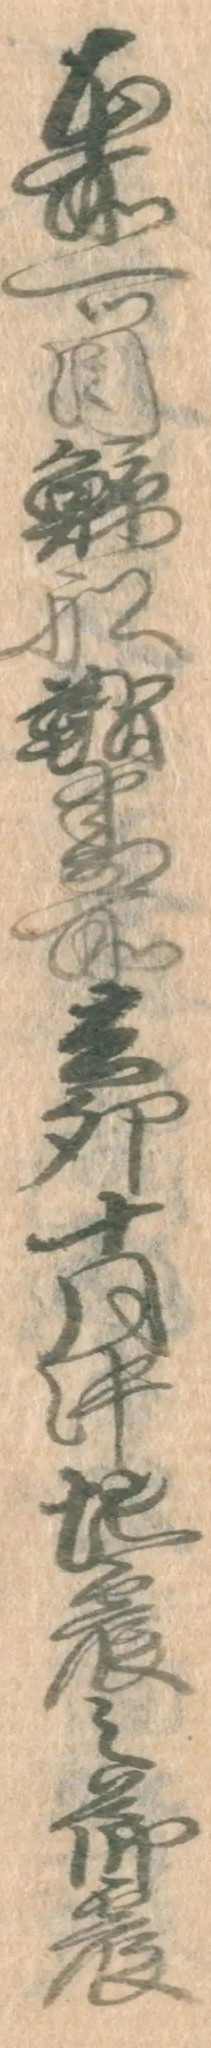本所一ツ目鯨船鞘番所去卯十月中地震之節震
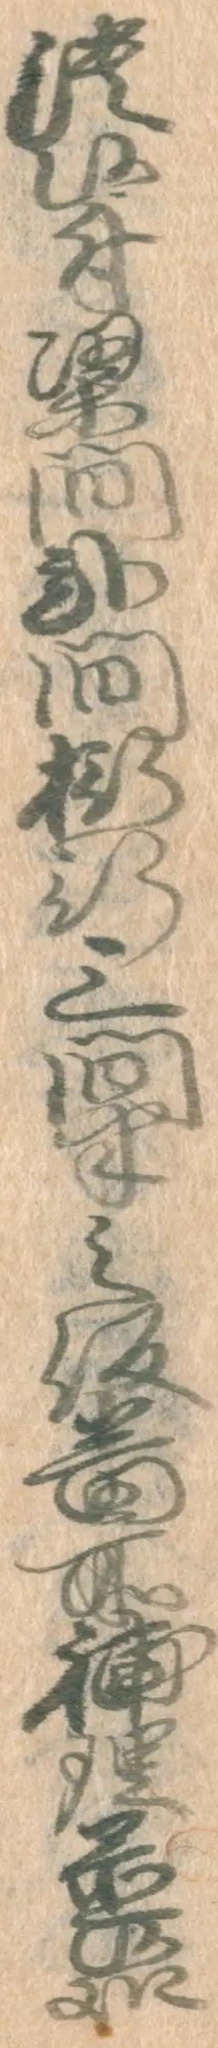潰候ニ付梁間弐間桁行三間半之仮番所補理置候処
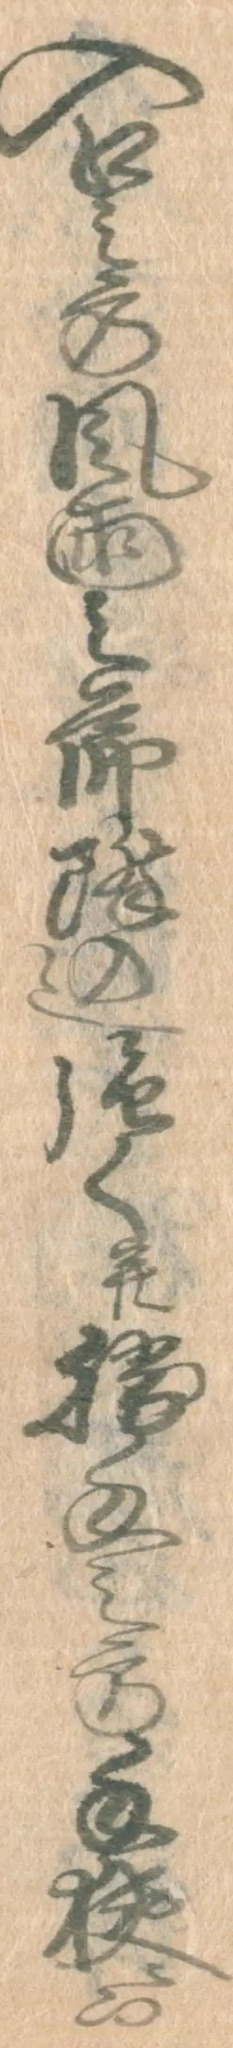入口之方風雨之節降込強く并勝手之方手狭ニ而
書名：地震災書留 2巻. [1] 内表紙に「地震災書留　安政二卯年　但本所深川御用屋敷地代免除調」とあり
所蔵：国立国会図書館 National Diet Library, JAPAN
